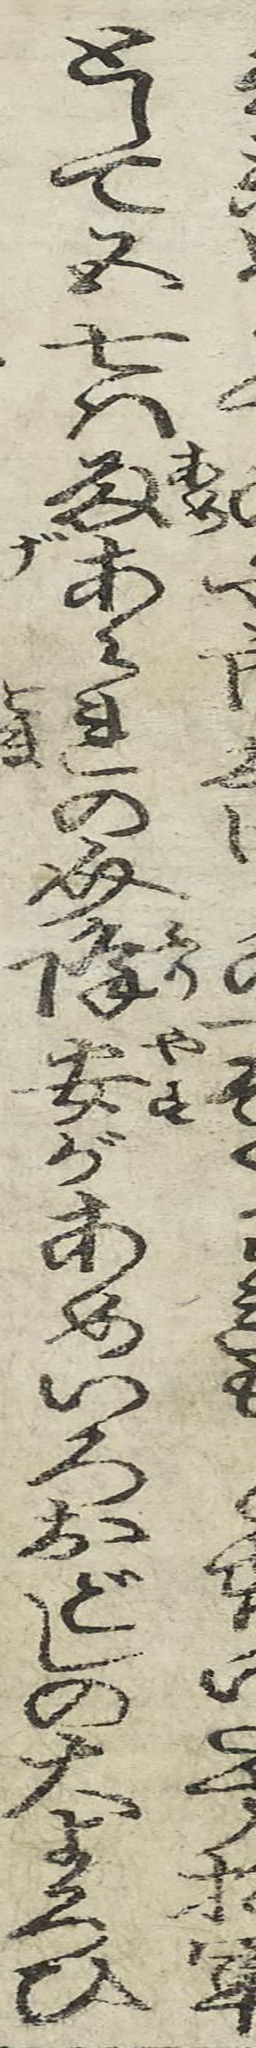として五七は雨あられの介降安があめいろおどしの大よろひ
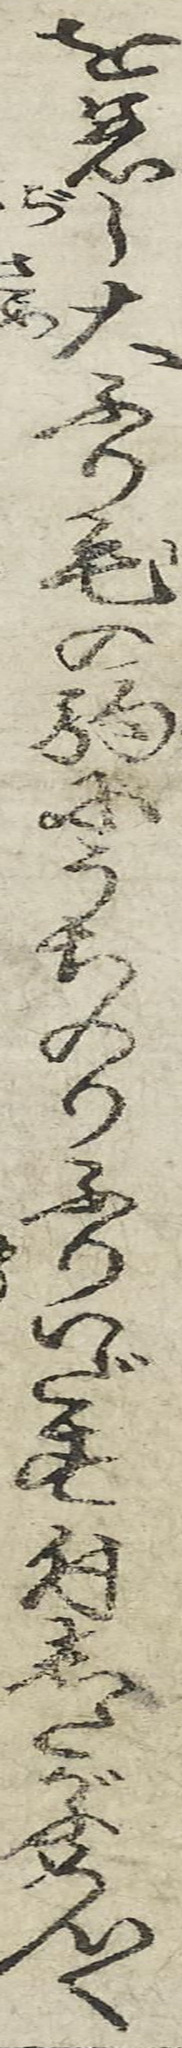を着し大ふり毛の駒にうちのりふりいだす付したがふめん〳〵
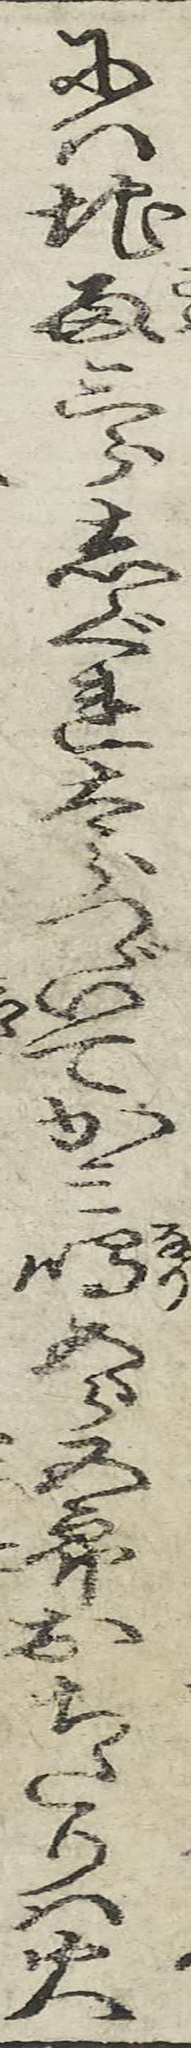には地雨三郎しぐれ太郎つゞいてかみ鳴五郎五郎おちたりは火
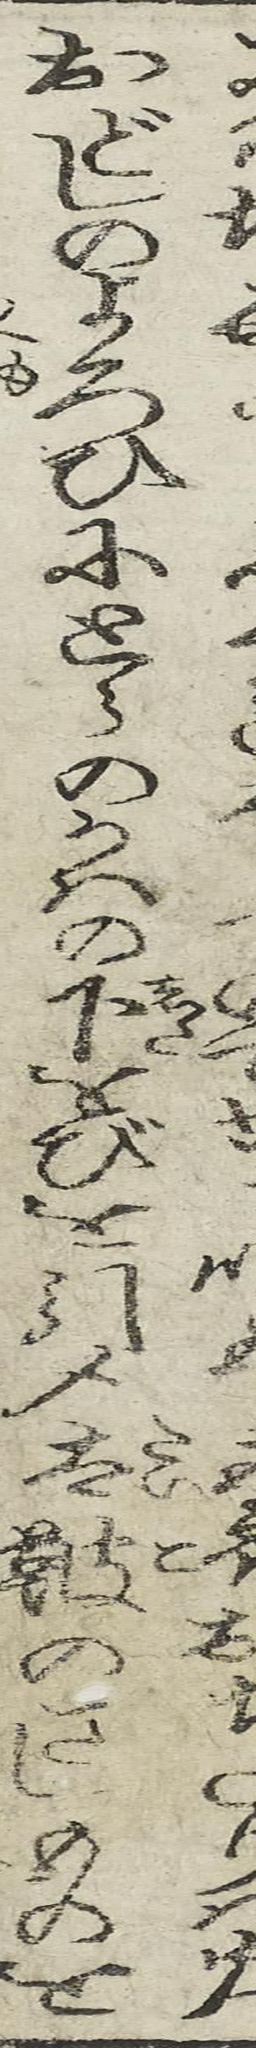おどしのよろひにとらのかはの下をびを引〆太鼓のさしものを
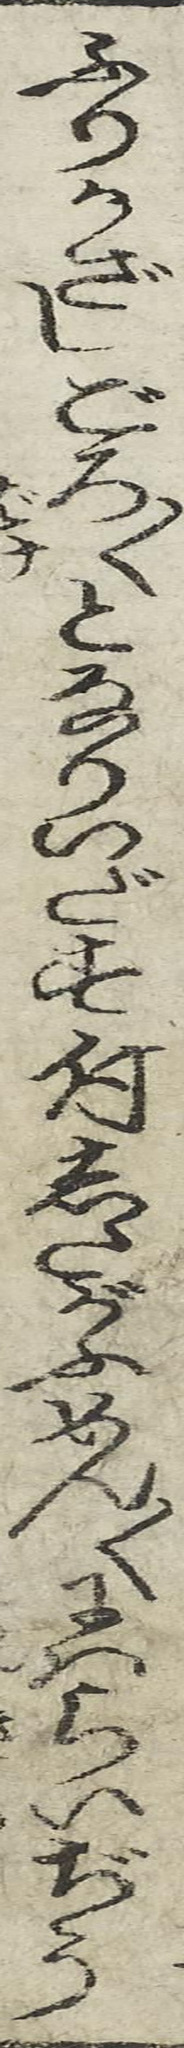ふりかざしごろ〳〵となりいだす付したがふめん〳〵にはらいぢう
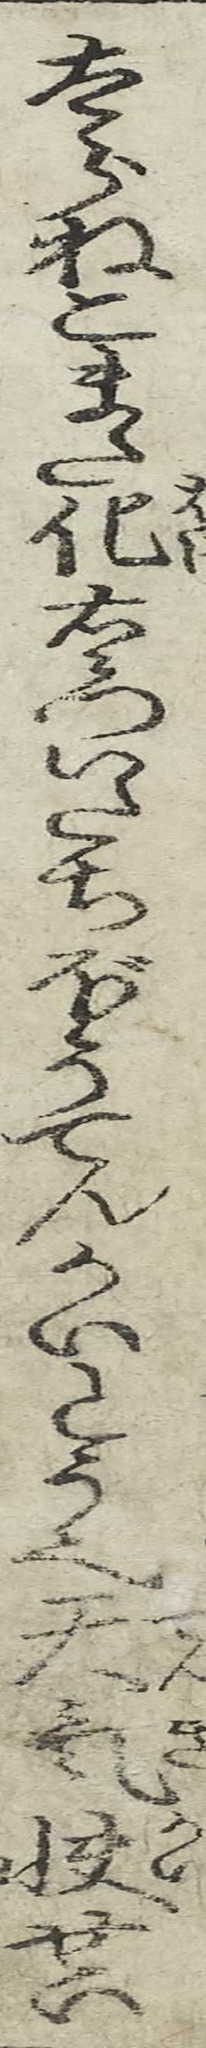太郎ねこまた化右衛門いたちぼうてんかいとうへ天気快せい
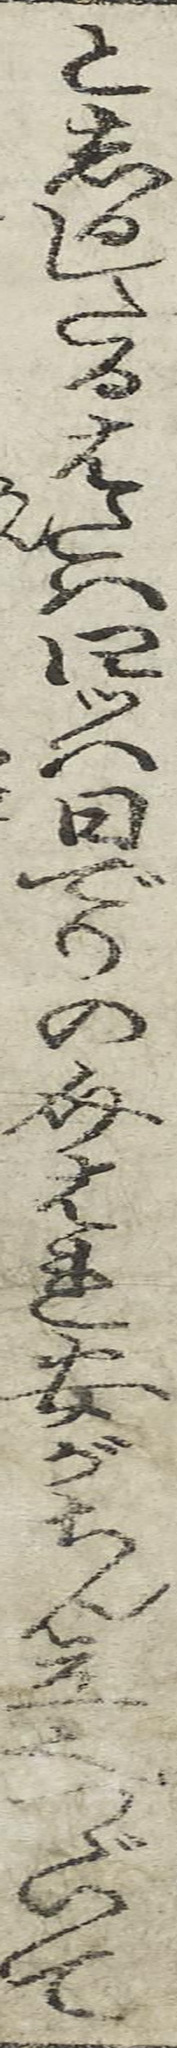としるしたるはたは四ツは日でりの介はれ安がちん笠也つゞいて
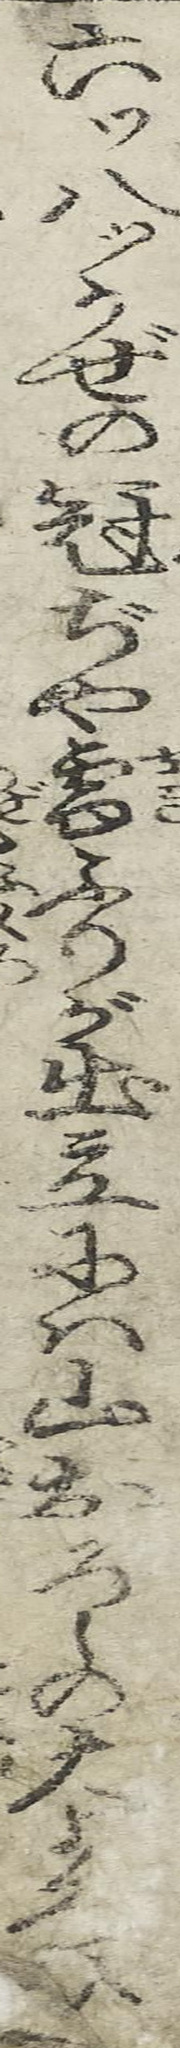六ツ八ツうぜの冠ぢや雪ふりが出立には山おろしの大よろひ
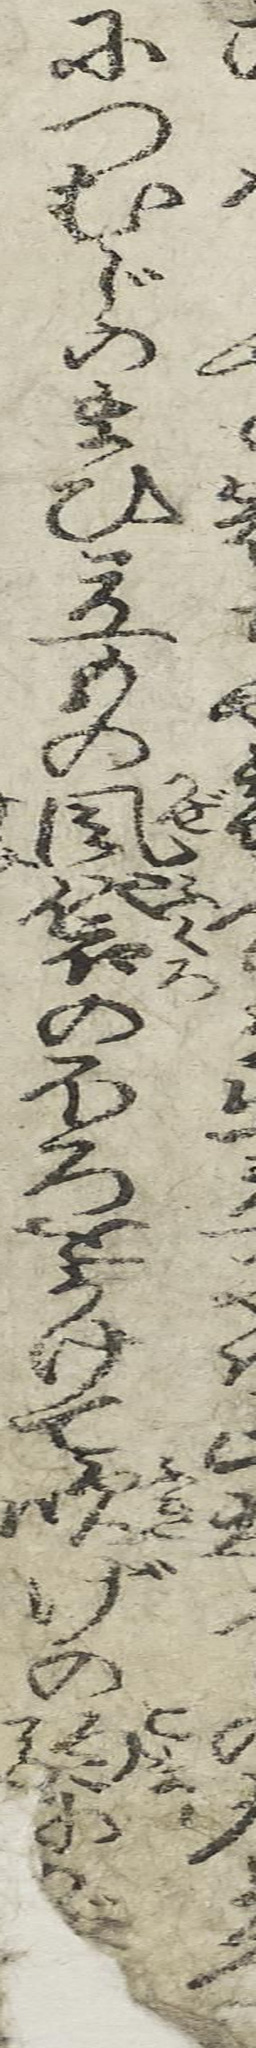につむじのまひ立もの風袋のほろをうけて吹げの駒に
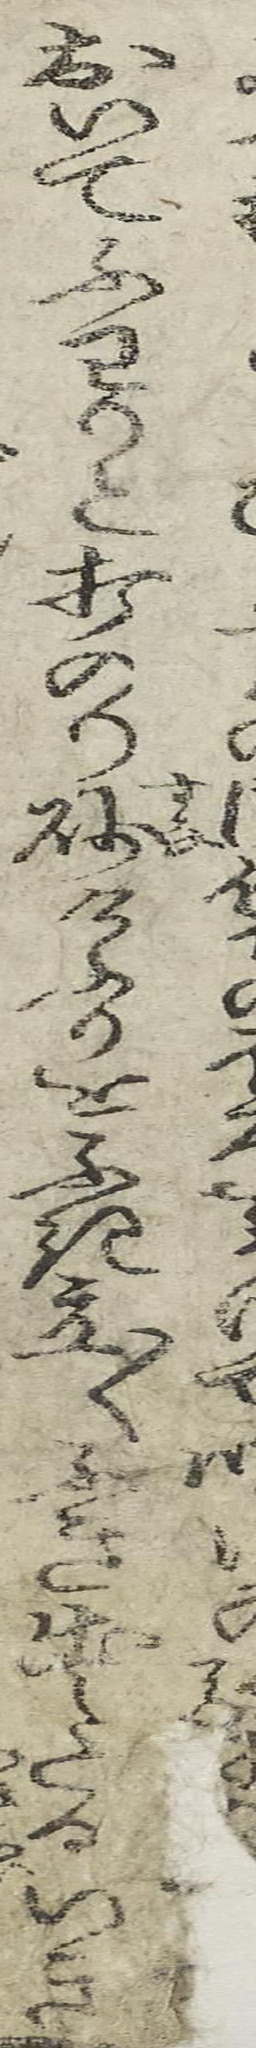おいてふわりと打のり砂けふりをふき立〳〵ふき出したるいき
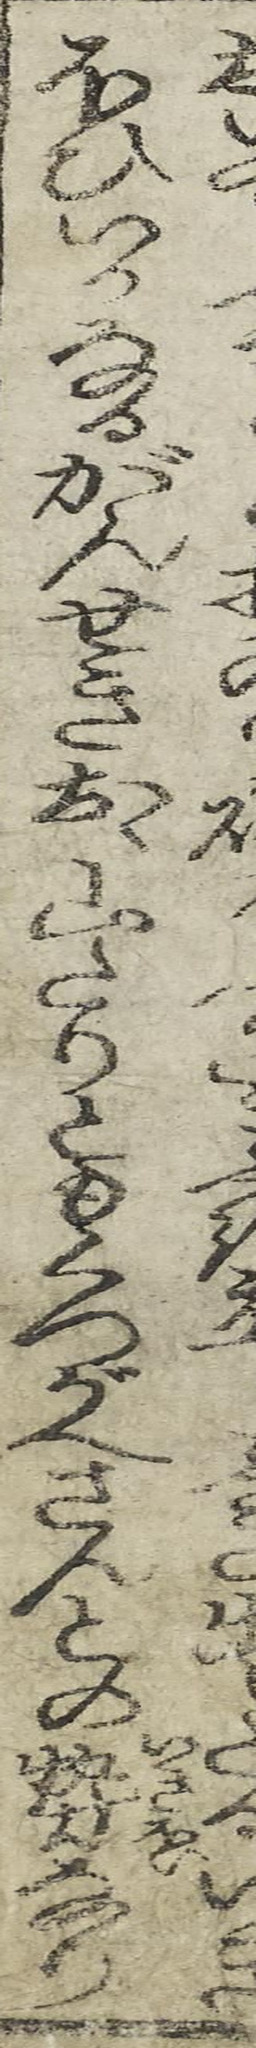ほひいかなるがんせきおゝ山たりともくつがへさんとの勢なり

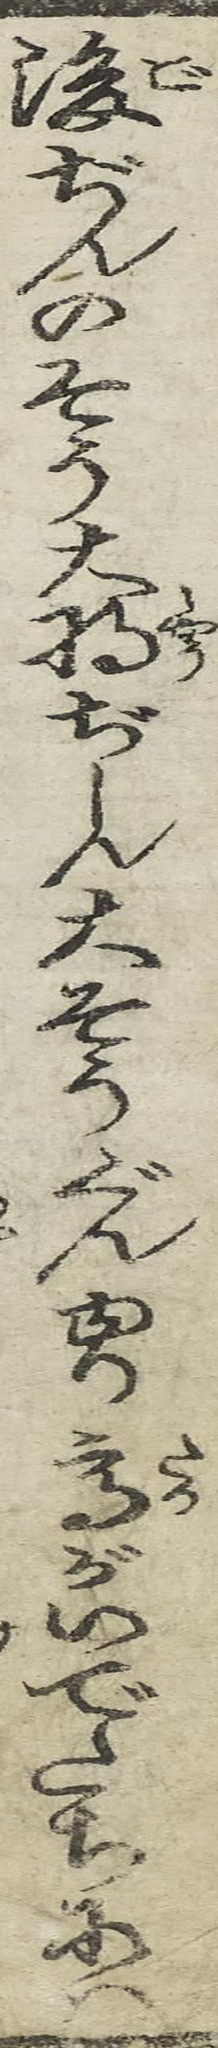後ぢんのそう大将ぢしん大そうぐんゆり高がいでたちには
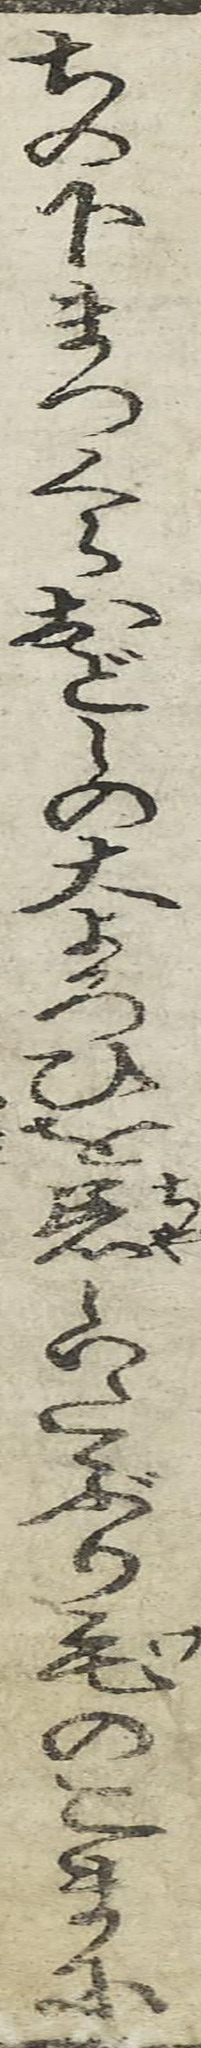ちの下まつくらおどしの大よろひを着しいたぶり毛のこまに
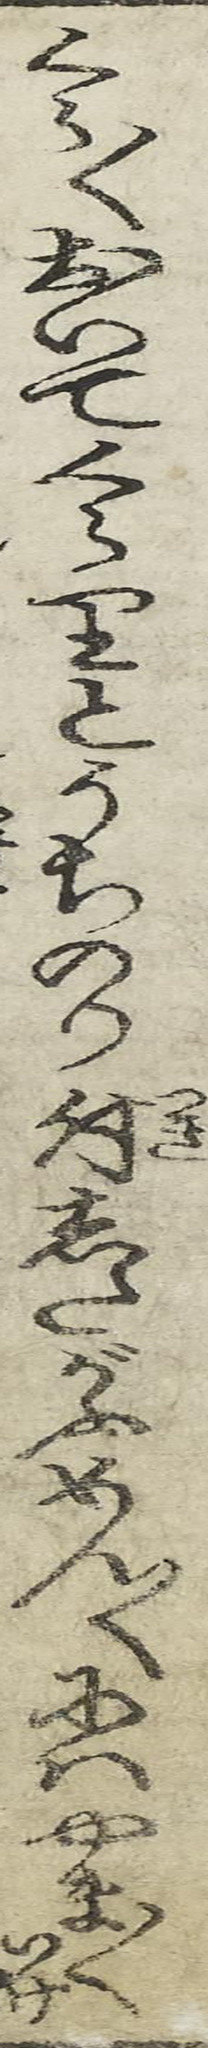くら〳〵おいてくらりとうちのり付したがふめん〳〵にはやま〳〵
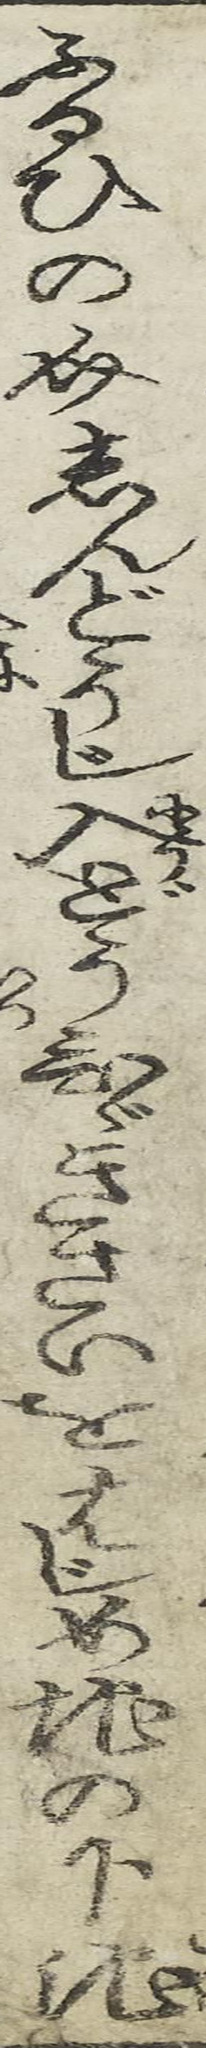ふるひの介しんどうじ入どうひゞきさいをはじめ地の下池
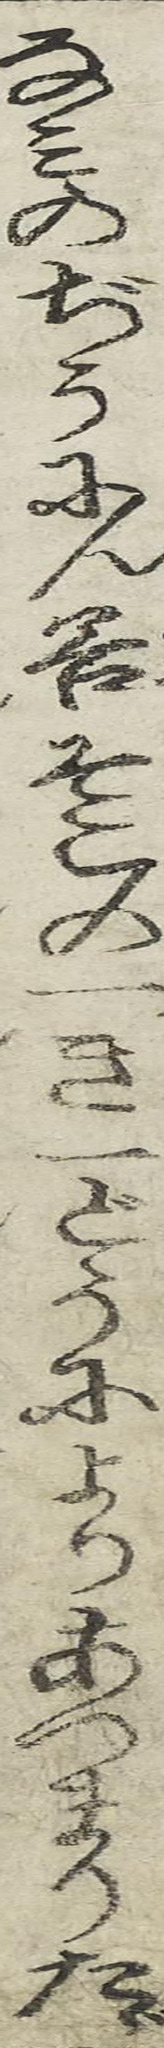なみのぢうにん谷そこの一き一どうによりあつまりたゞ
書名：新板ぢしん太平記
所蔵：東京大学地震研究所図書室 Earthquake Research Institute Library, The University of Tokyo, JAPAN
